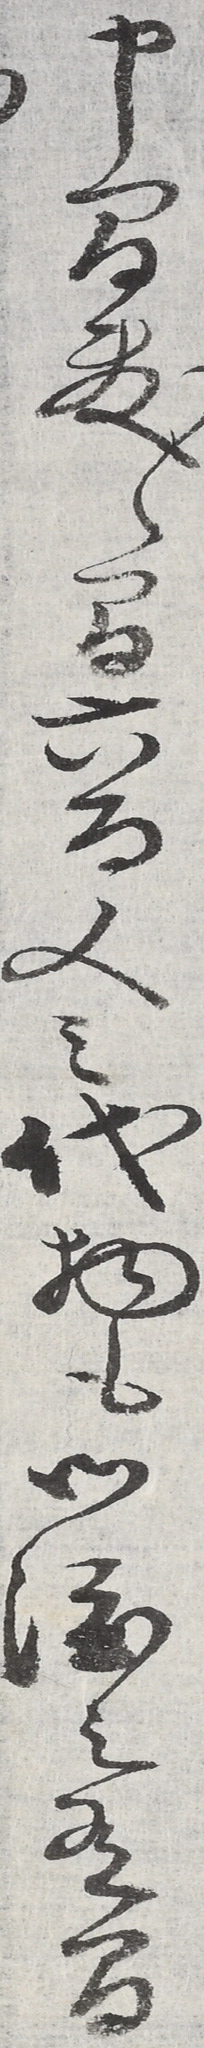申間敷候間六百文之代物も御渡シ有間
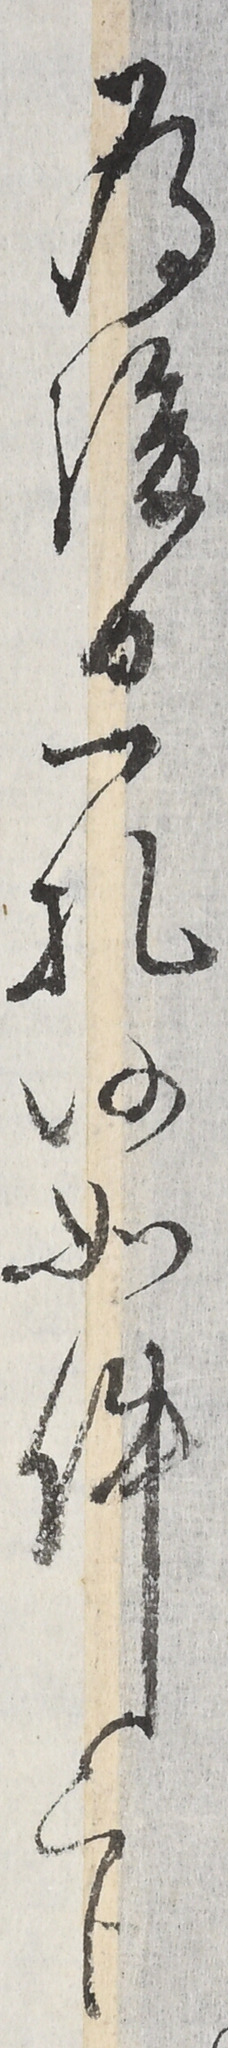為後日一札仍如件以上
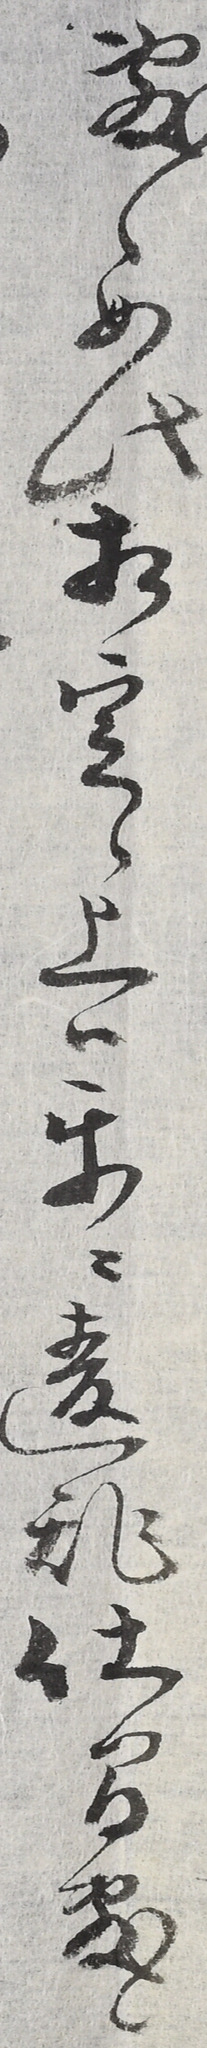敷候如此相定候上ハ互ニ違乱仕間敷候
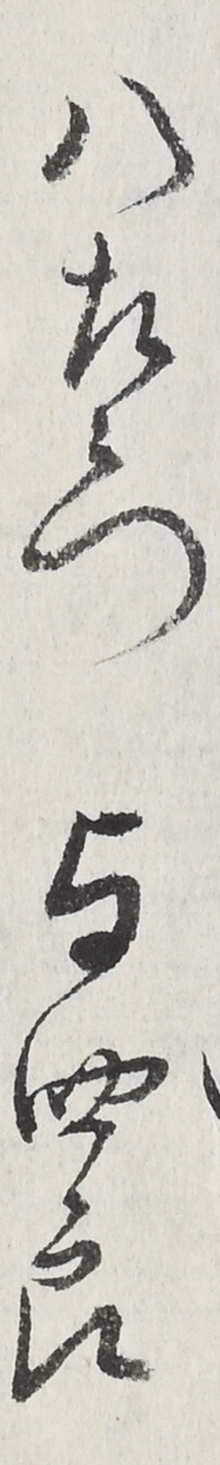八左衛門与四郎
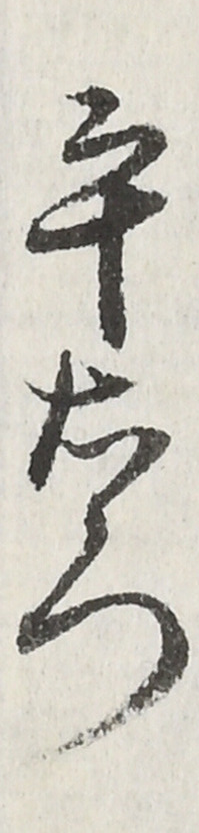源右衛門
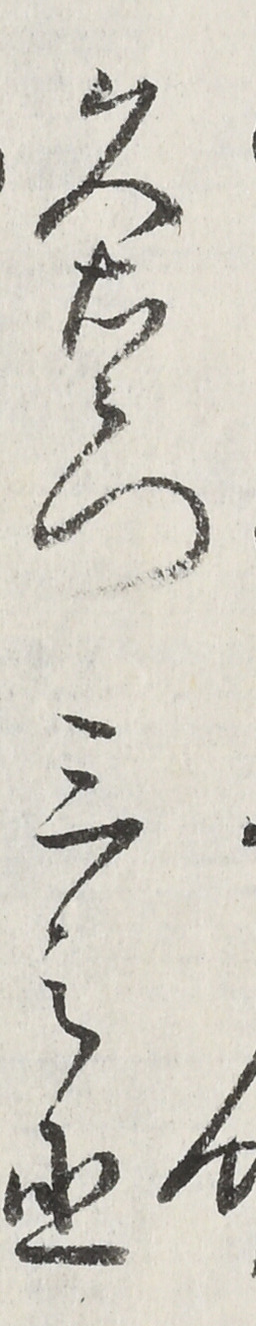久右衛門三之丞
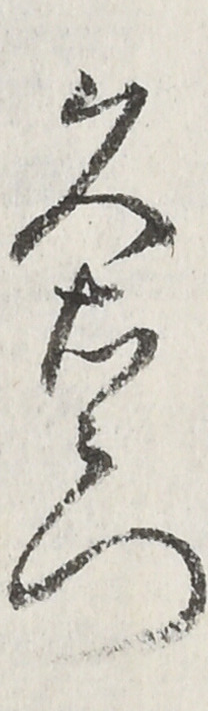源右衛門
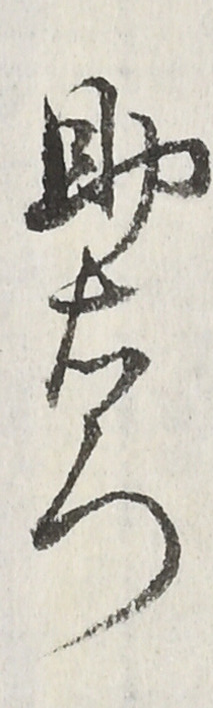源右衛門
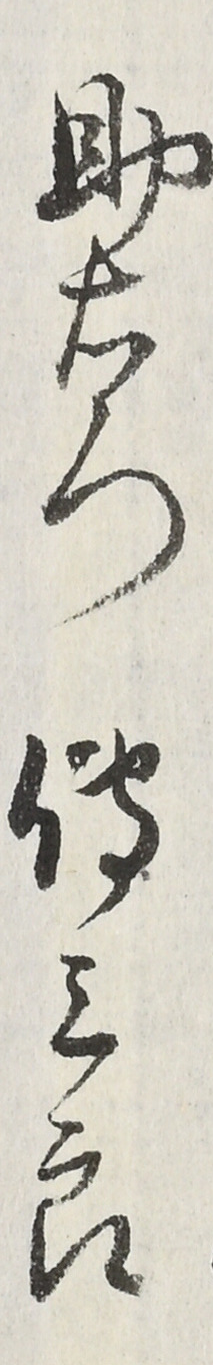助右衛門伝三郎
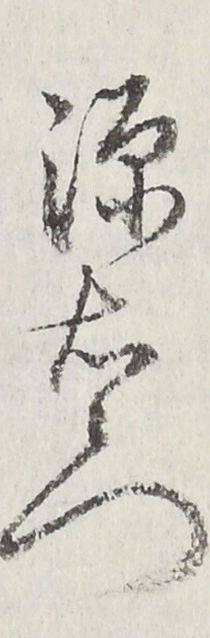源右衛門
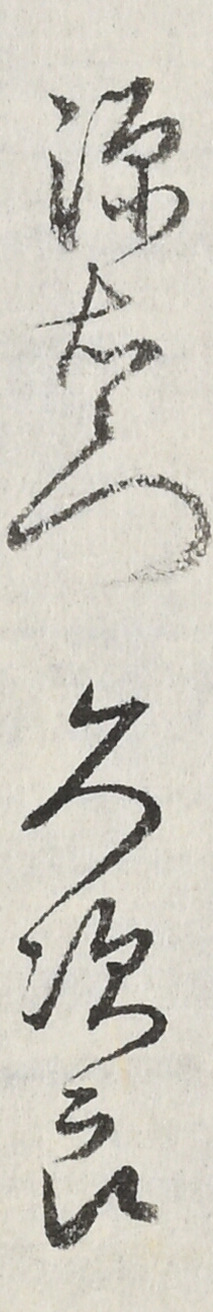源右衛門久次郎
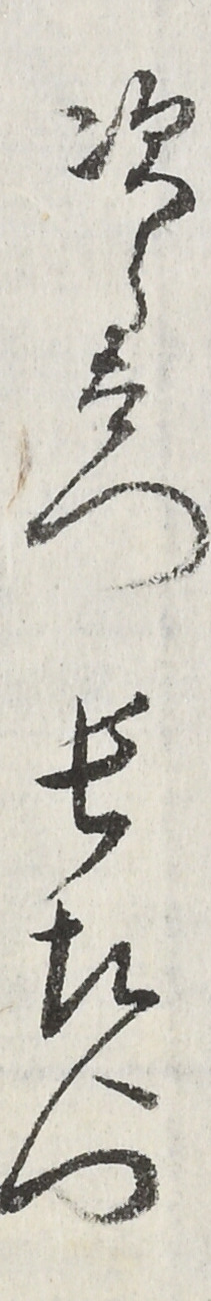次郎右衛門長左衛門
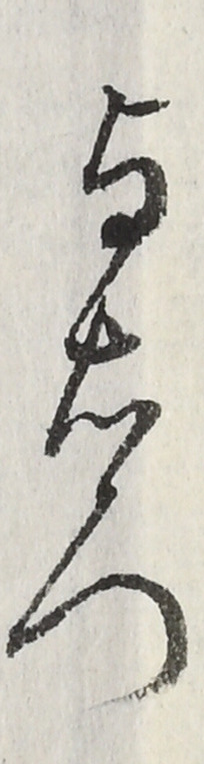源右衛門
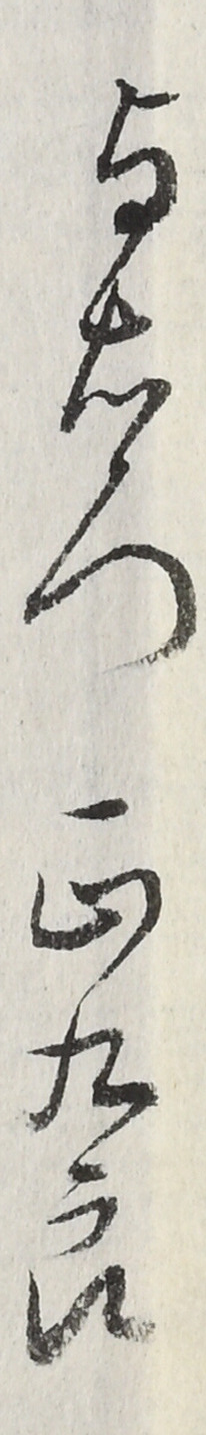与右衛門正九郎
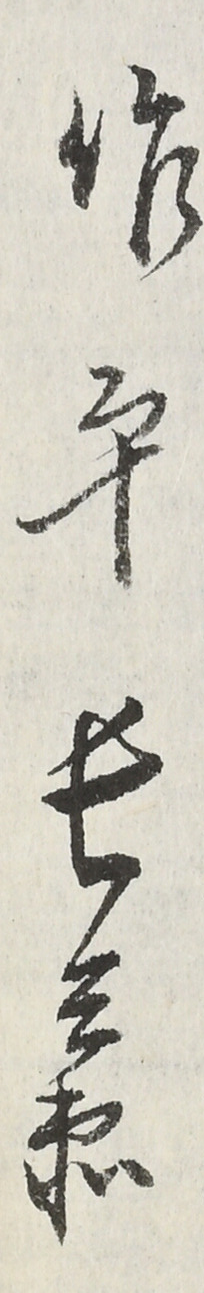作平長兵衛
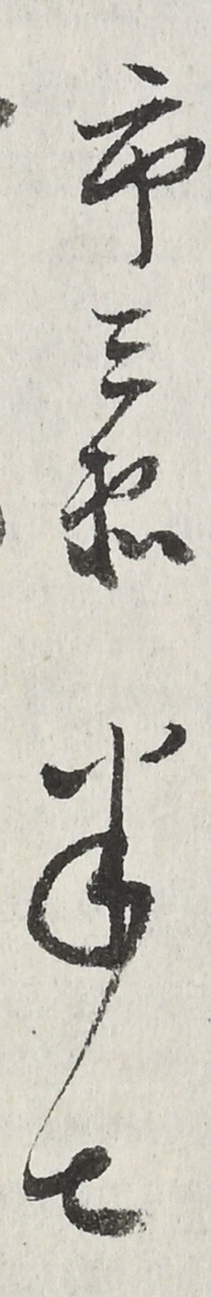市兵衛半七
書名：旧記
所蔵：伊那市立高遠町図書館・合同会社AMANE
